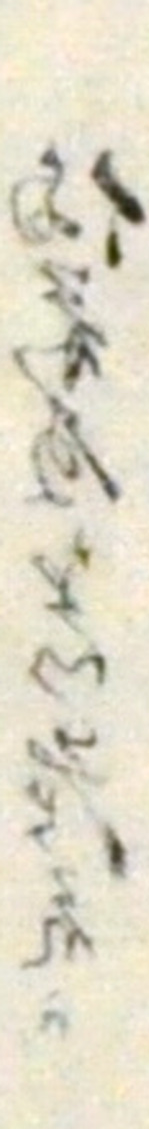八月廿七日
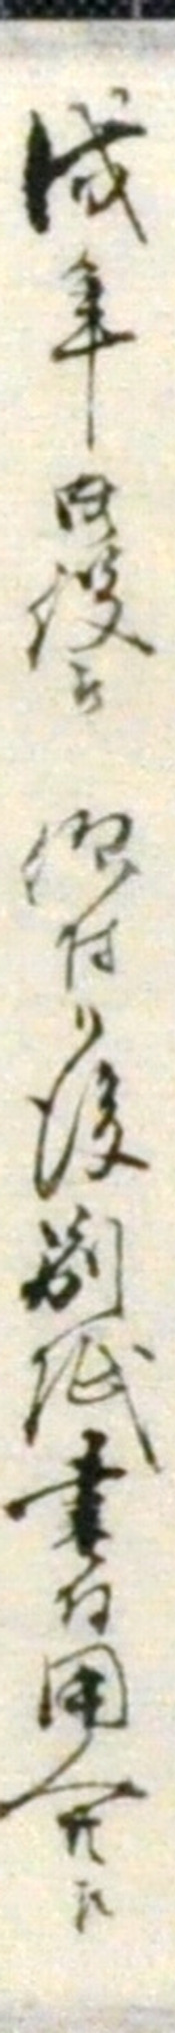戌年御役被仰付候後別紙書付用人共江
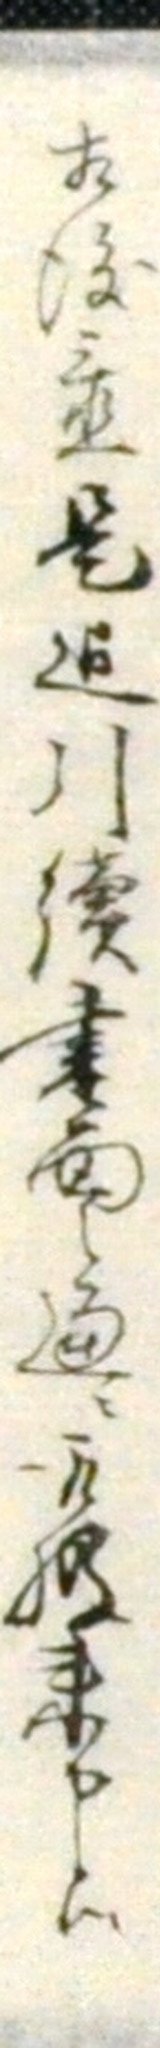相渡置是迄引続書面之通ニ取披来申候
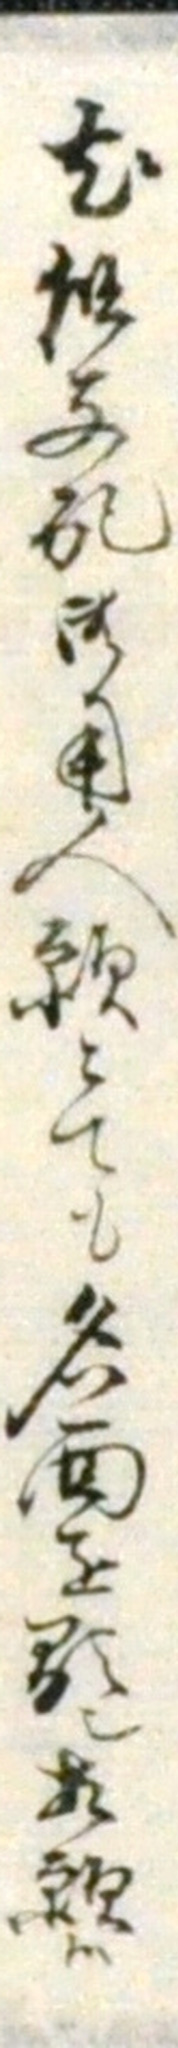尤組支配御用人願ニても名面を顕シ相願候
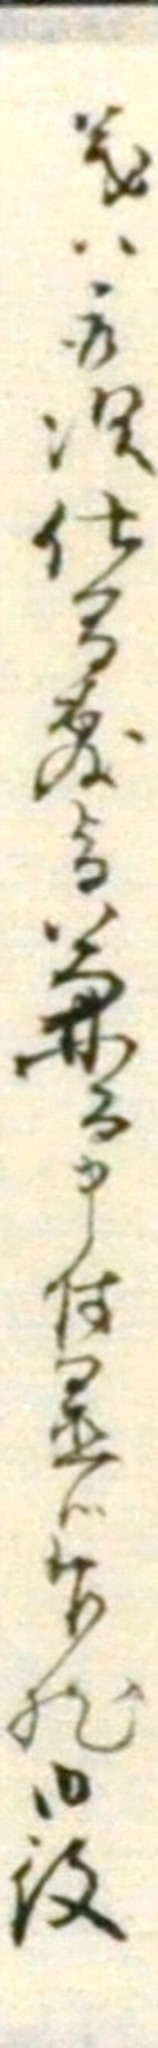義ハ取次仕間敷旨兼而申付置候乍然御役
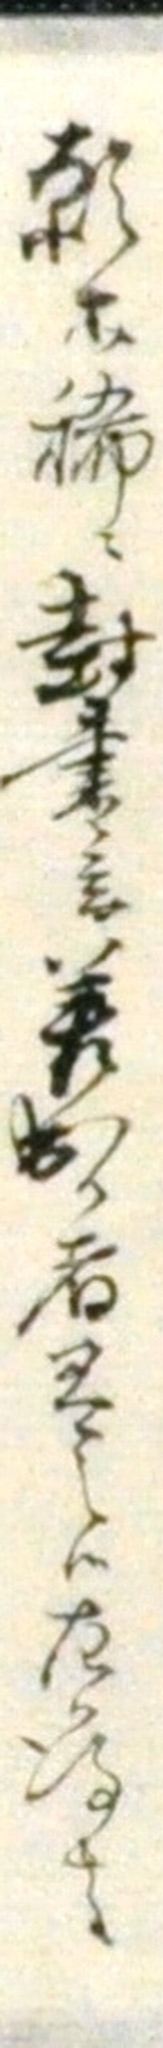願等稀ニ封書ニ而差出候者有之候左候得者
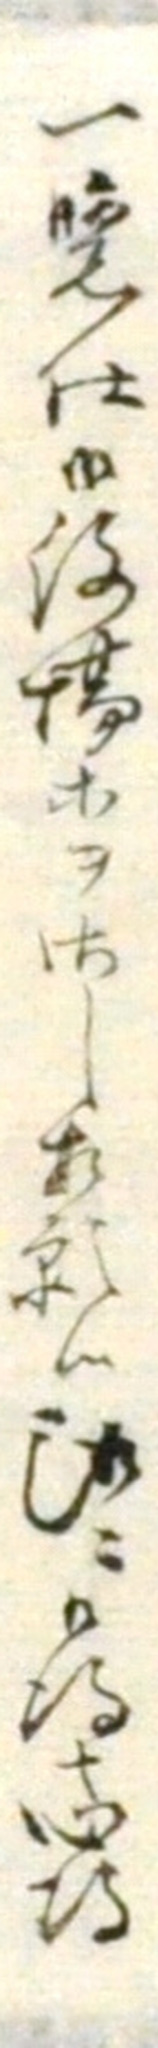一覧仕御役場等ヲ御し相願候趣ニ候得者心得
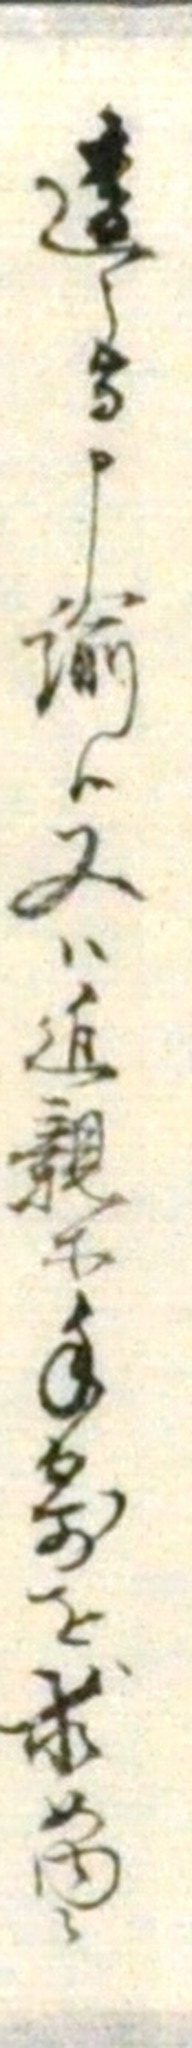違之旨申諭候又ハ近親等手寄を求め内々
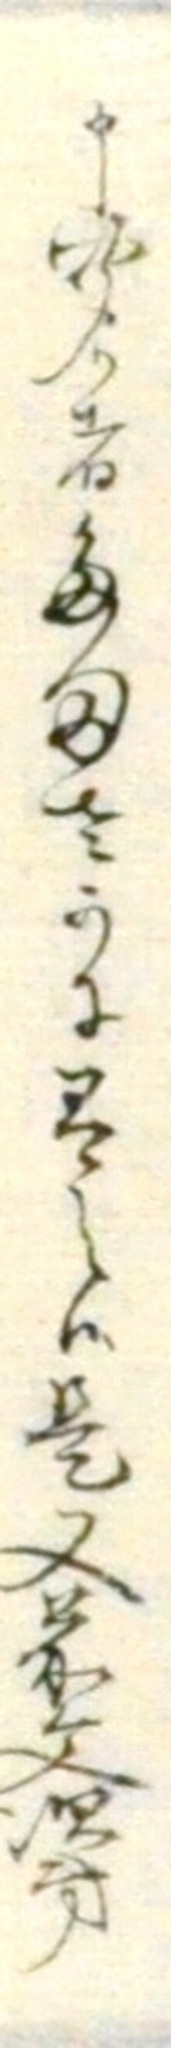申聞候者たまさかに有之候是又前文次第
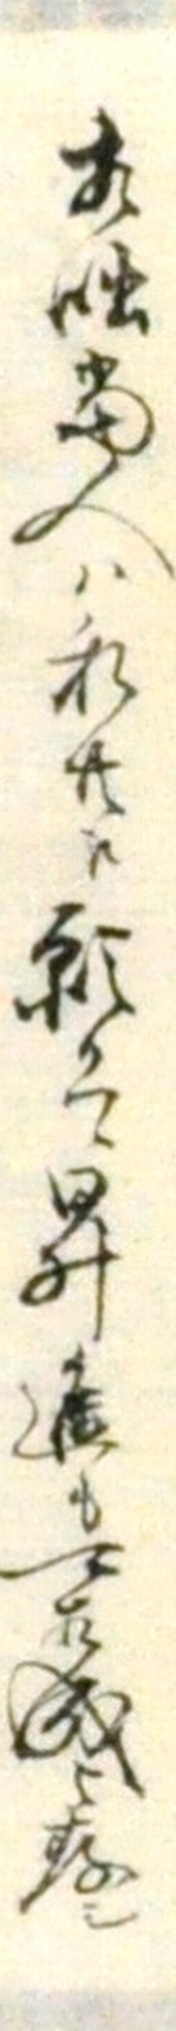相咄当人ハ私共江願候ハヽ昇進も可相成と存シ
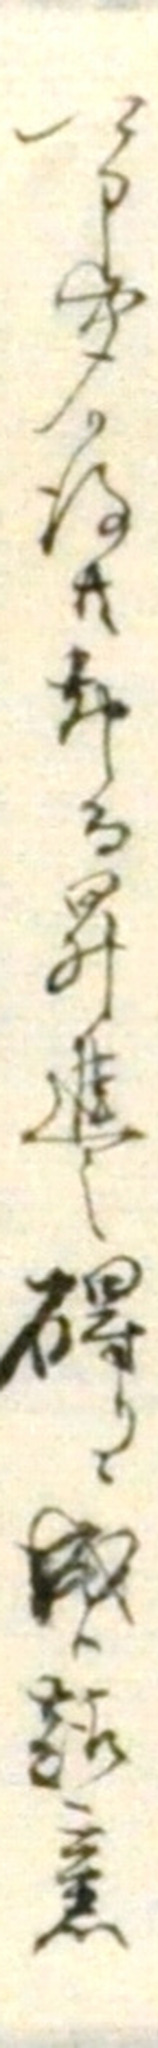可申聞候得共却而昇進之碍りニ成候趣意
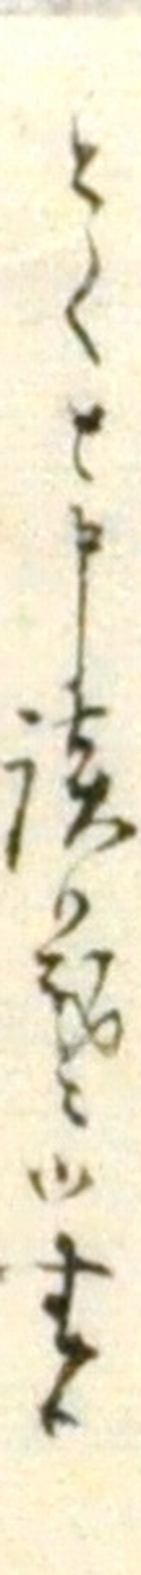とくと申談候義ニ御坐候
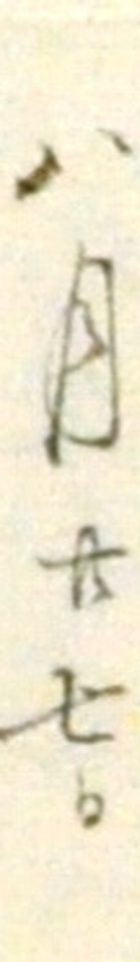八月廿七日
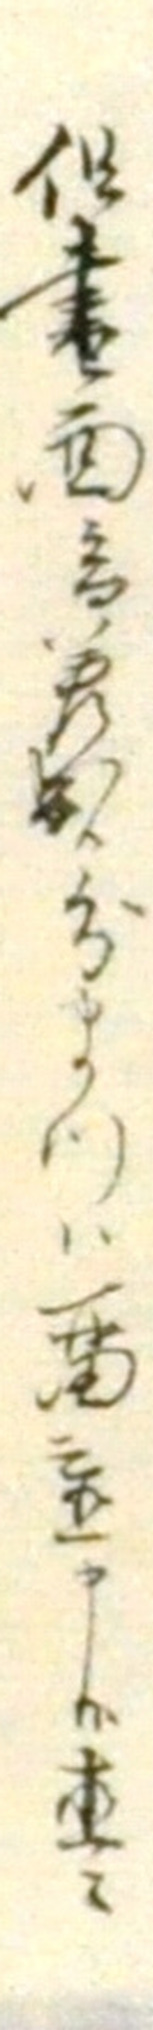但書面ニ而差出候分まつハ留置申候直ニ
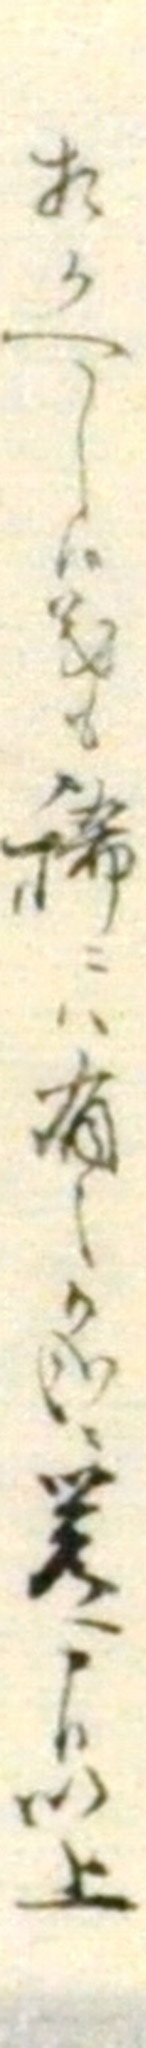相かへし候義も稀ニハ有之候哉ニ覚へ申候以上

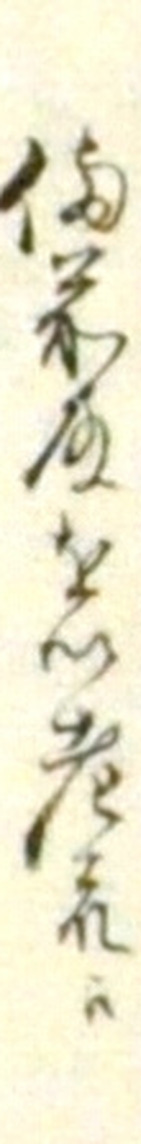備前殿を以老衆え
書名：備前殿ヲ以老衆ヘ差出候控
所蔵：伊那市立高遠町図書館・合同会社AMANE
